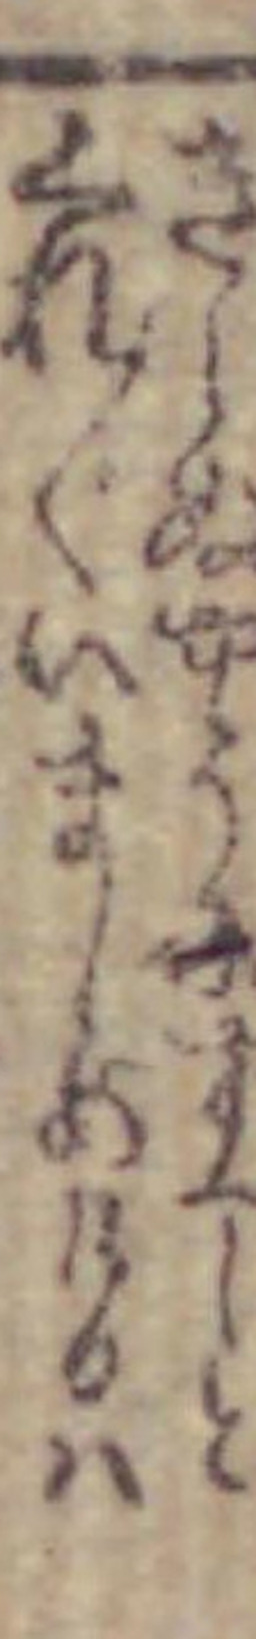くれ〴〵いましめけるは
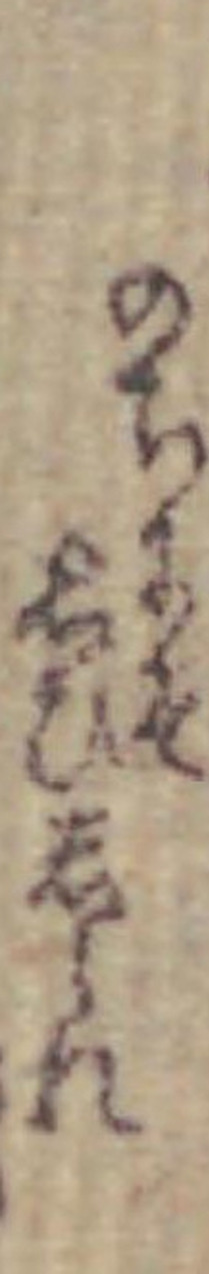思ひしられ
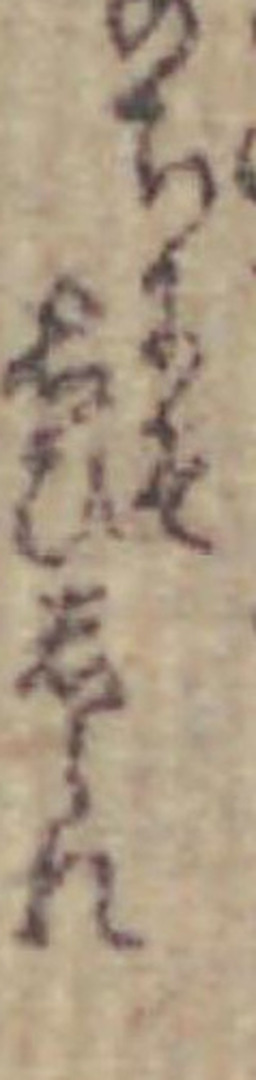思ひしられ
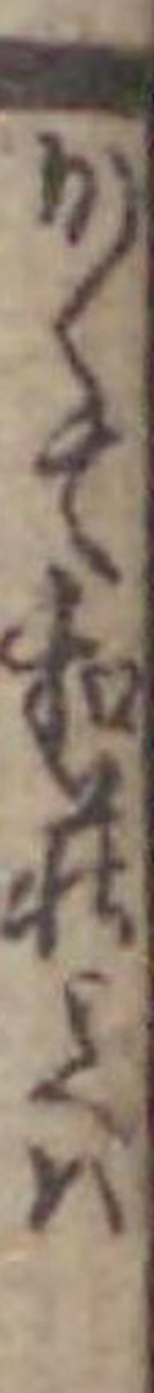かくて和荘兵へは
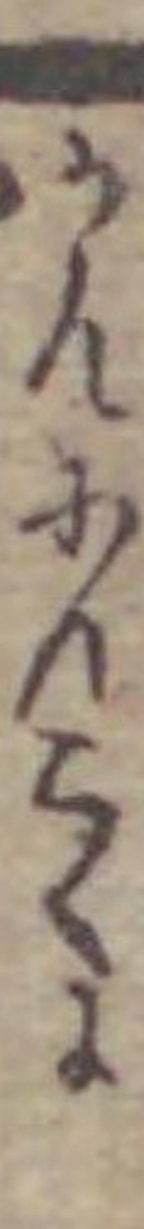かんにんこくに
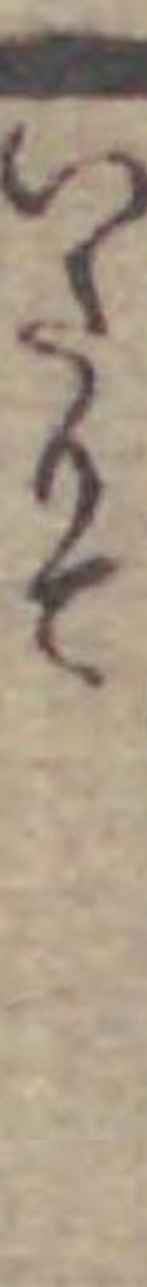いたりて
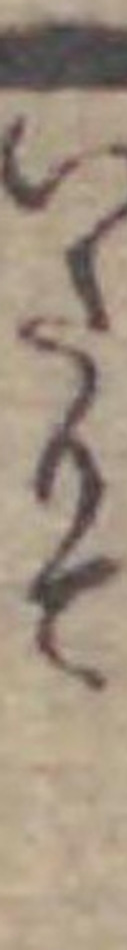いたりて
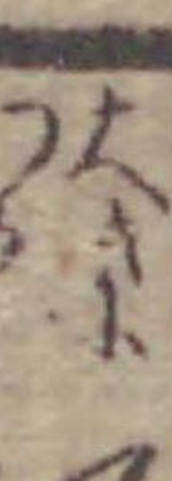大きに
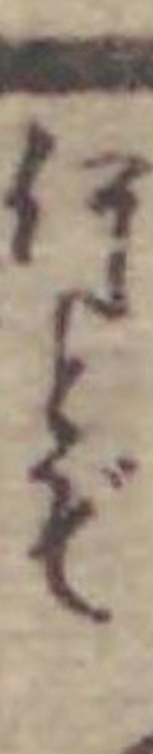何とぞ
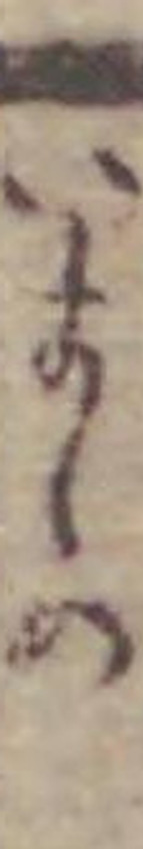いましめ
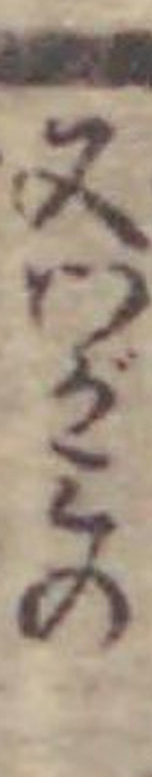又わがみの
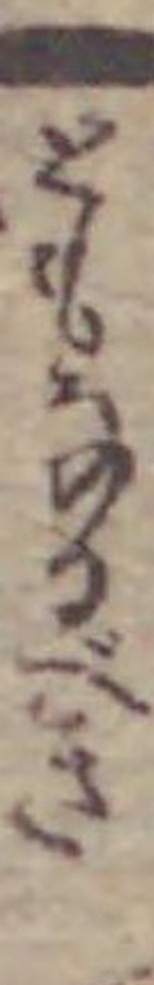ともなるべき
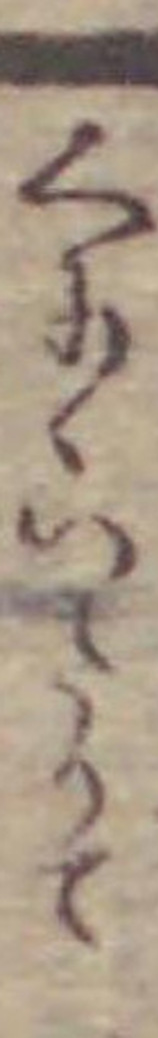くにゝいたりて
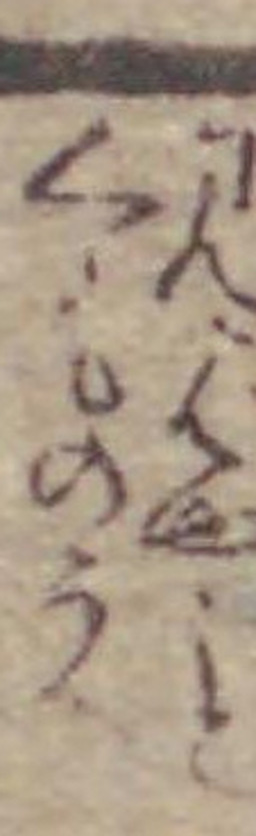くものうへ
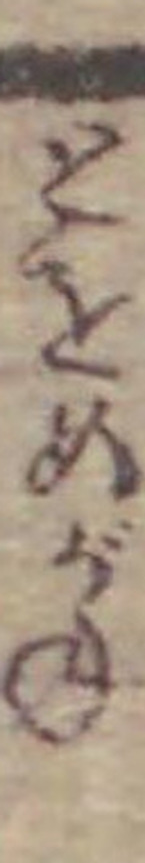とをめがね
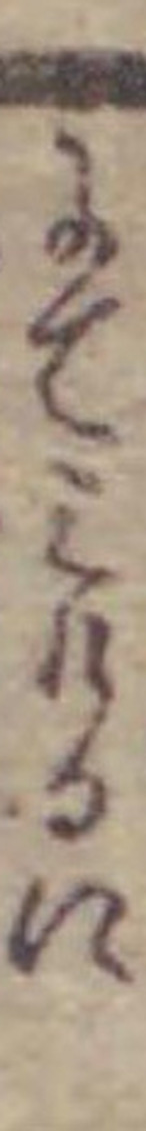にてみけるに
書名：和荘兵衛後日話 : 3巻
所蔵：国立国会図書館 National Diet Library, JAPAN
